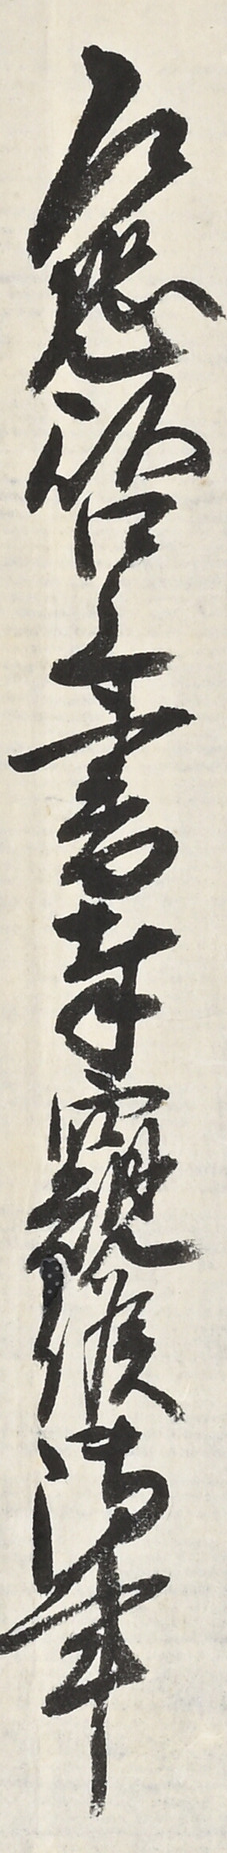乍恐以口上書奉窺候御事
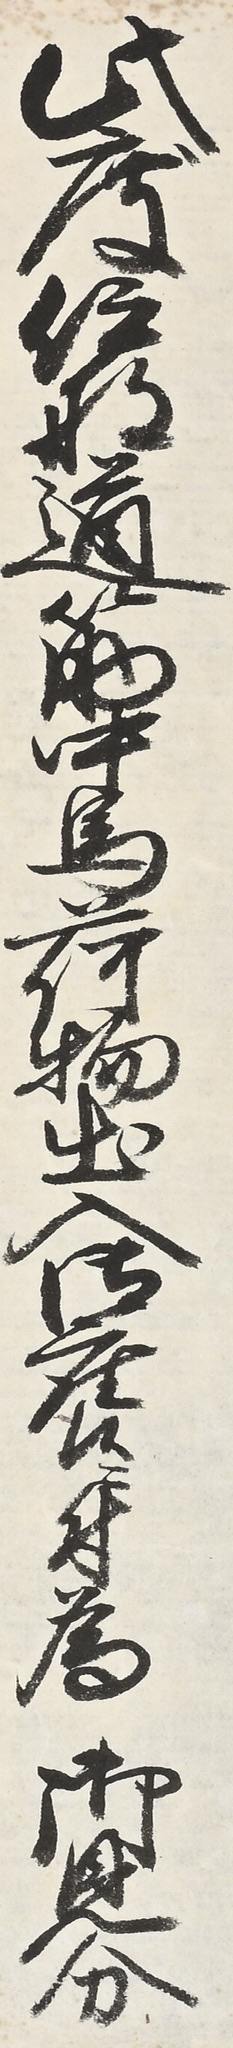此度伊那道筋中馬荷物出入御座候ニ付為御見分
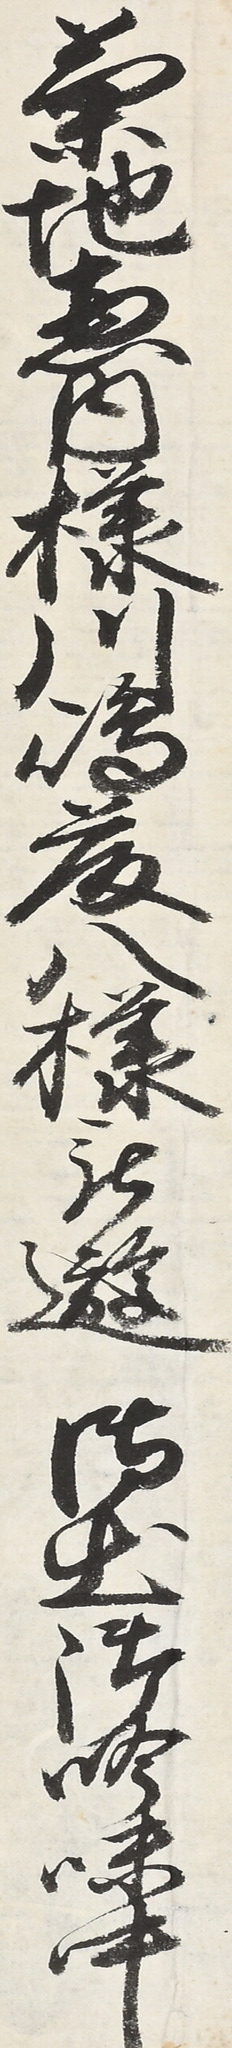菊地惣内様川嶋藤八様被遊御出御吟味中
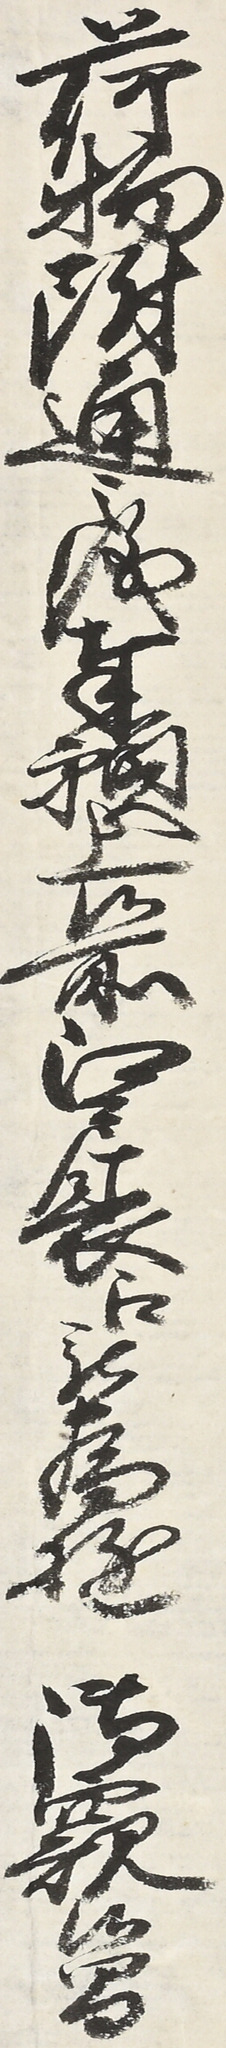荷物附通之儀奉願上候所江戸表江被為遊御窺候間
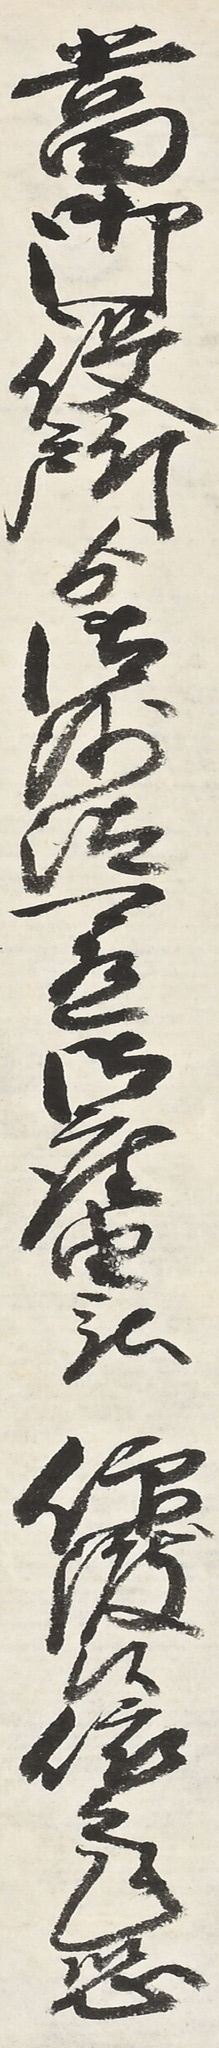当御役所ゟ御沙汰可有御座由被仰渡候依之乍恐
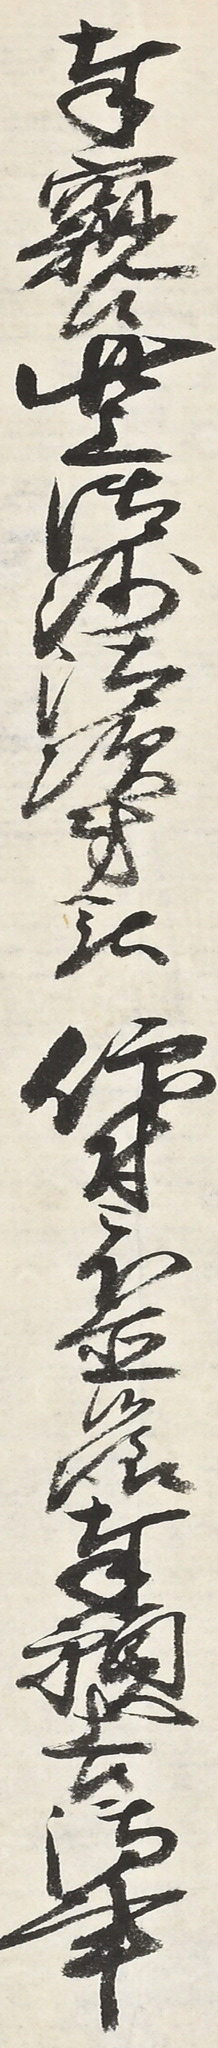奉窺候此上御沙汰次第被仰付被下置候様奉願上候御事
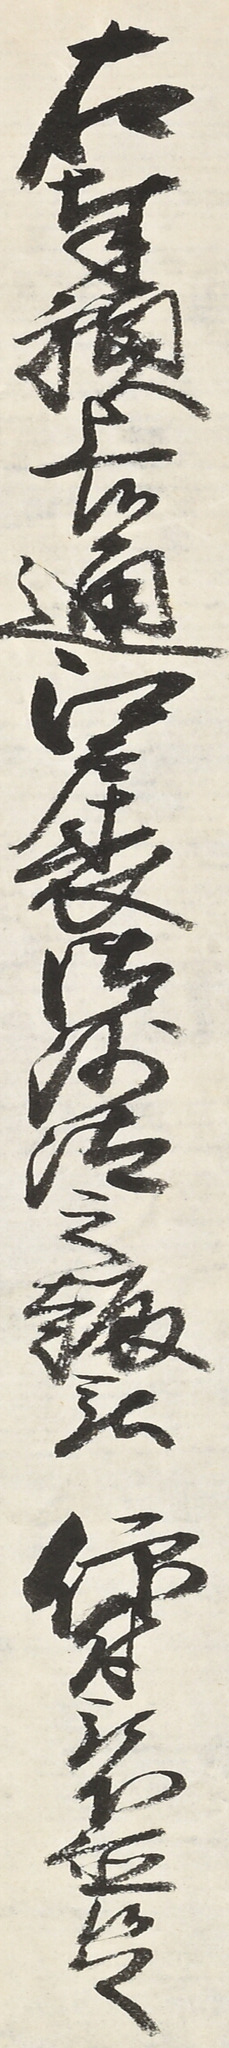右奉願上候通江戸表御沙汰之趣被仰付被下置候ハヽ
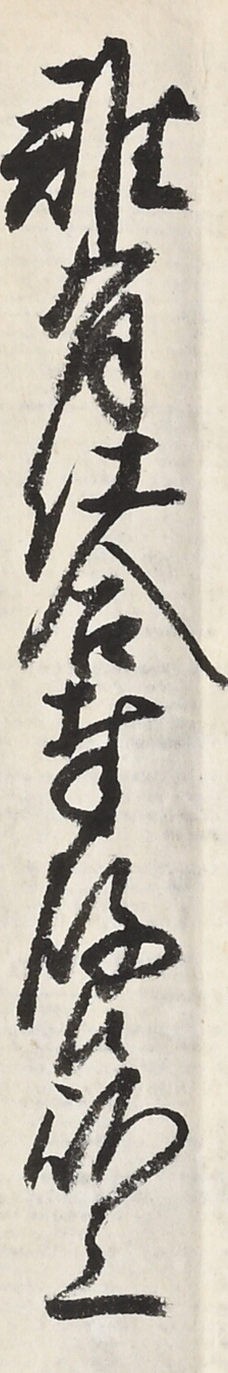難有仕合奉存候以上
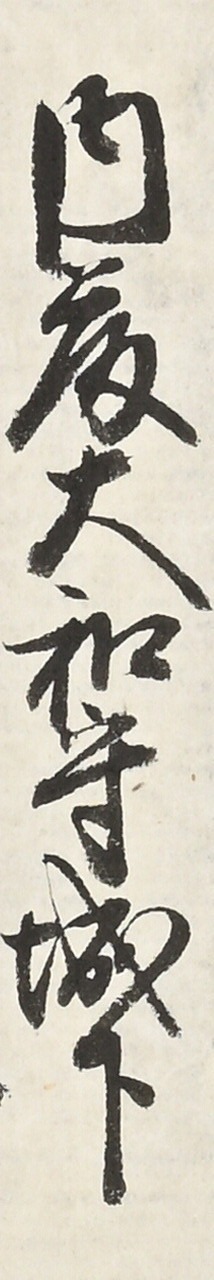内藤大和守城下
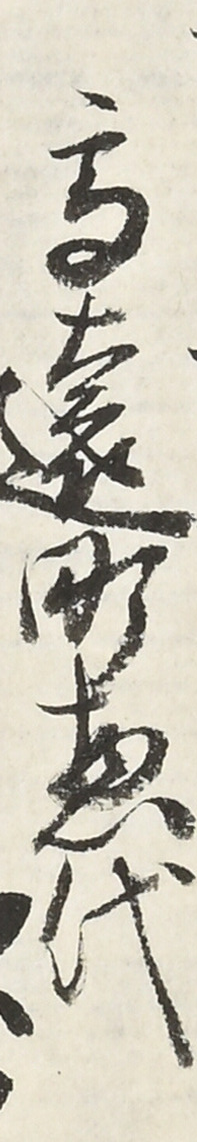高遠町惣代
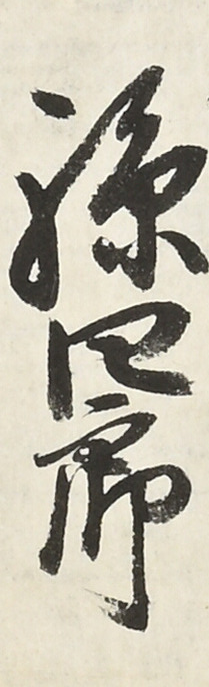孫四郎
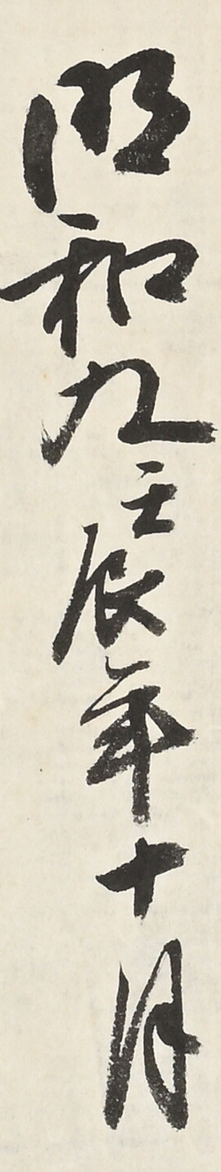明和九壬辰十月同断
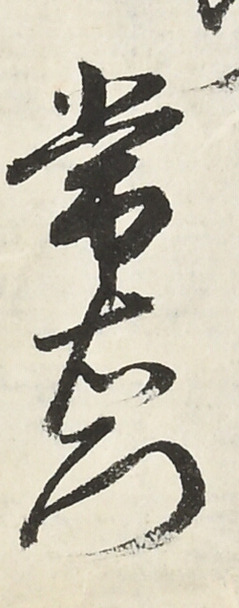常右衛門
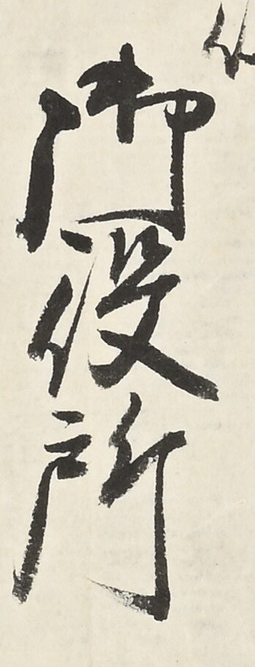御役所

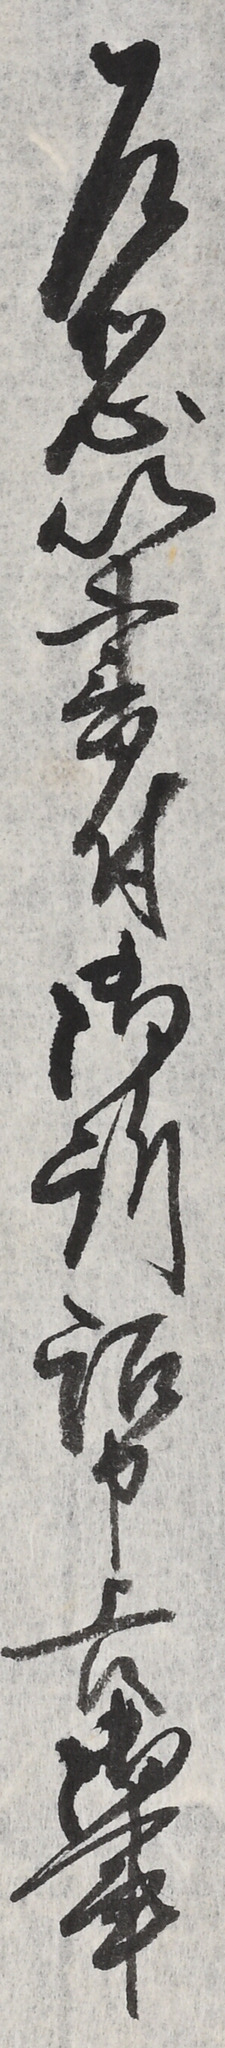乍恐以書付御訴訟申上候御事
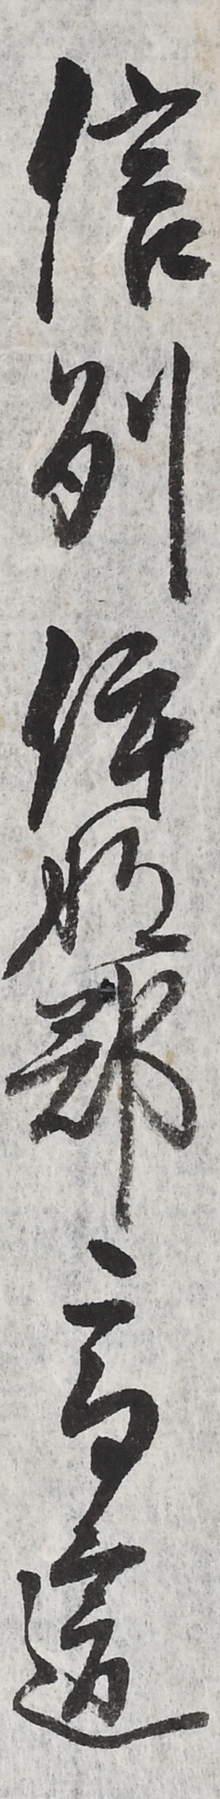信州伊那郡高遠
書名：乍恐以書付御訴訟申上候御事
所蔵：伊那市立高遠町図書館・合同会社AMANE
